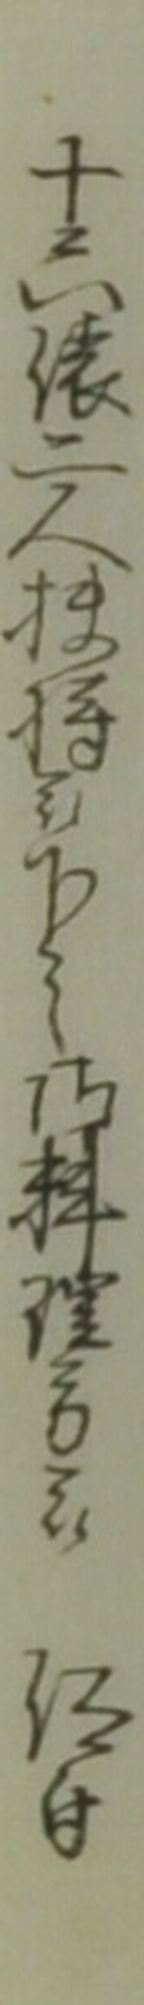十六俵二人扶持被下之御料理被仰付

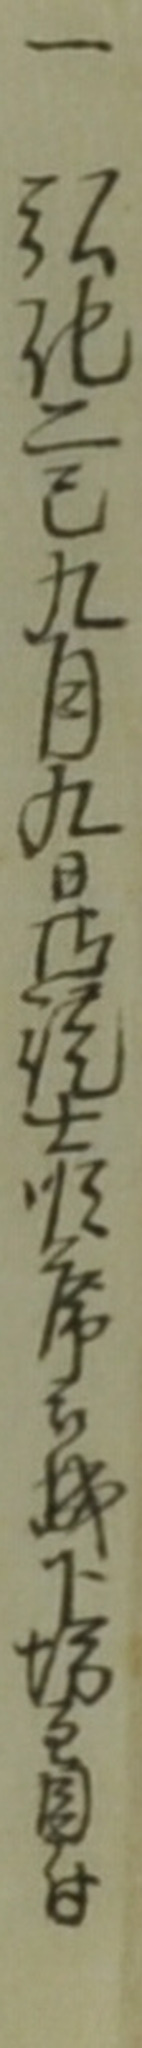一弘化二巳九月九日御徒士順席被成下坊主目付
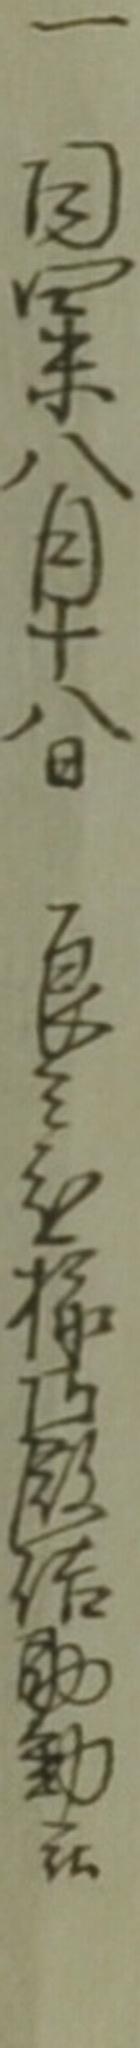一同四未八月十八日良之進様御殿詰助勤被
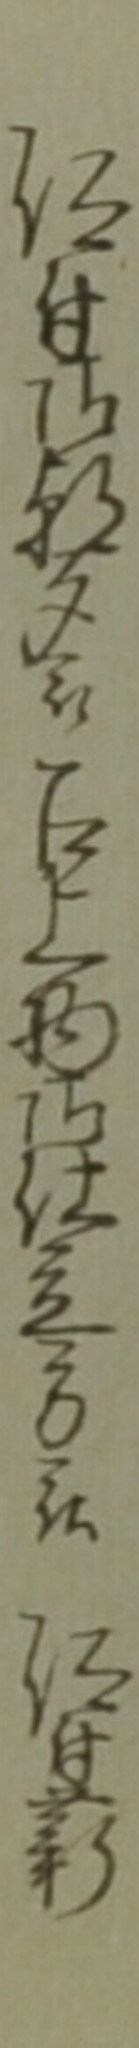仰付御朝夕被召上物御仕立方被仰付被
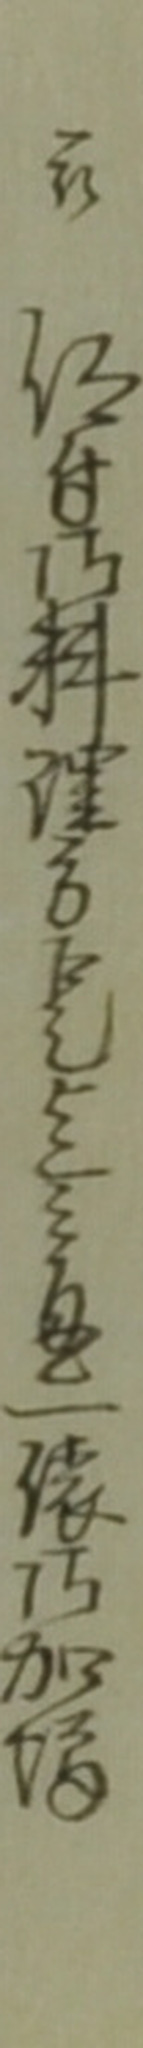被仰付御料理方是迄之通一俵御加増
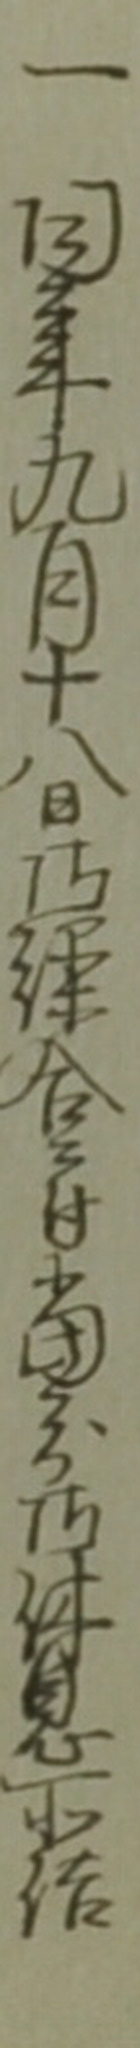一同年九月十八日御繰合ニ付当分御休息所詰
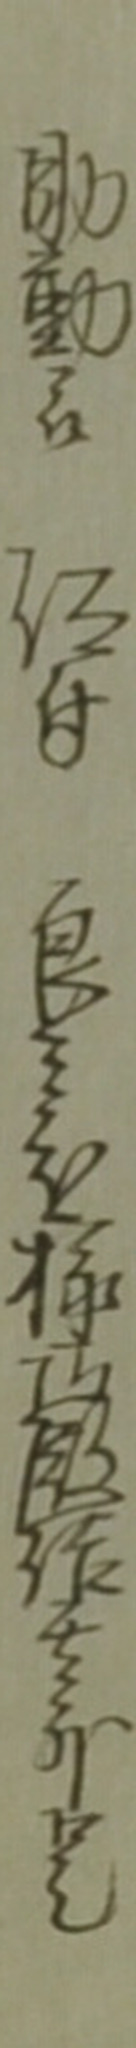助勤被仰付良之進様御殿詰其外是
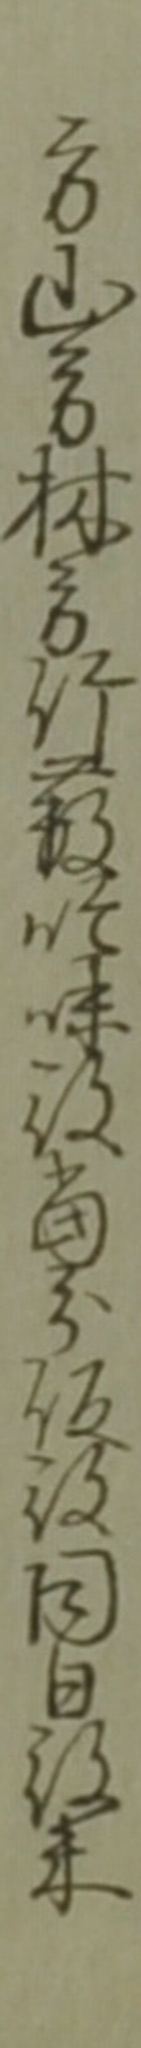方山方林方竹薮吟味役当分仮役同日役米
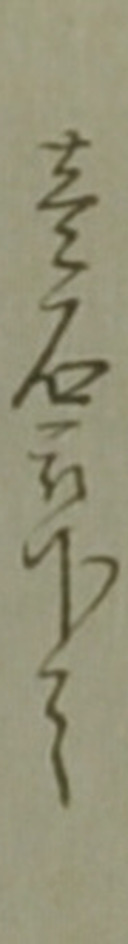壱石被下之
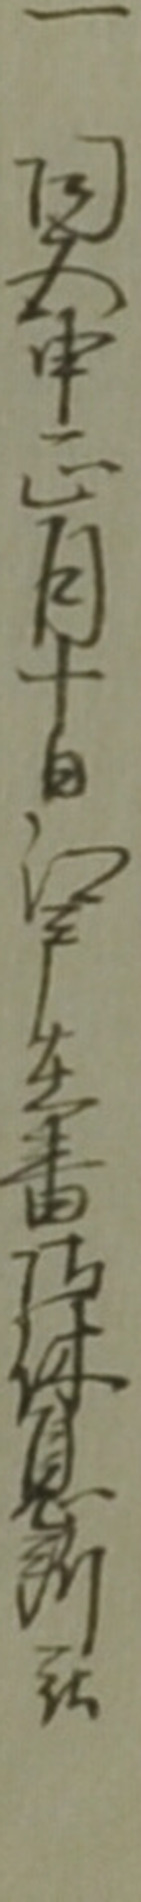一同五申正月十日江戸在番御休息所被
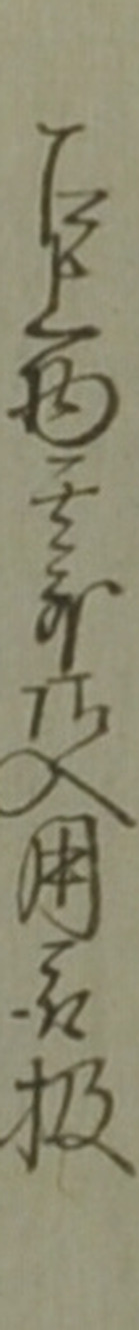召上物其外御入用取扱
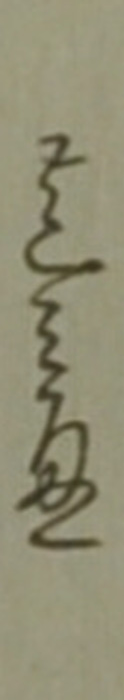迄之通
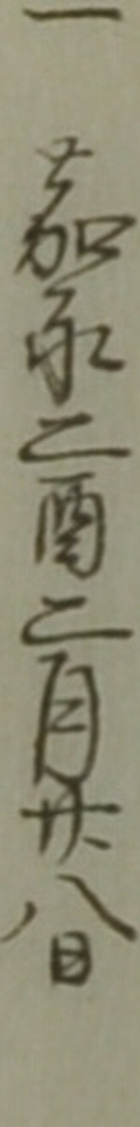一嘉永二酉二月廿八日
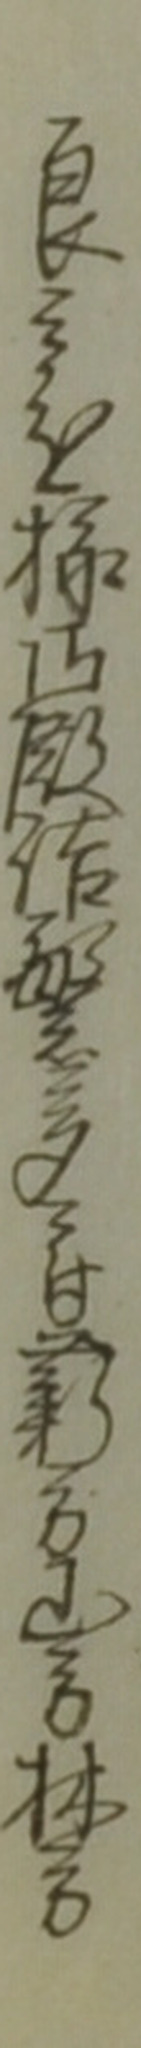良之進様御殿詰繁多ニ付薪方山方林方
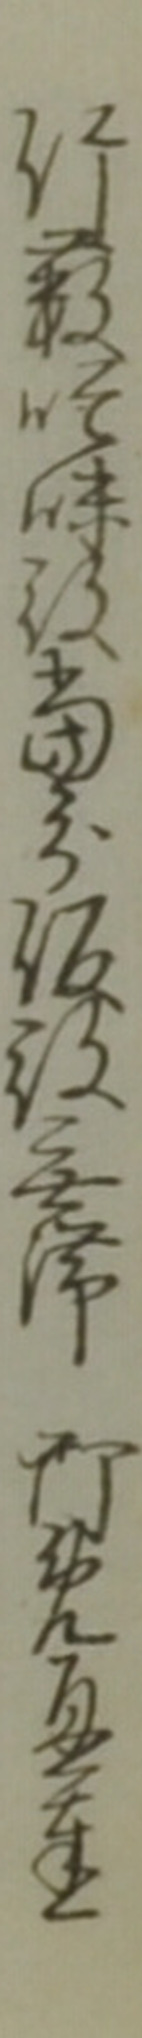竹薮吟味役当分仮役無滞御免通達
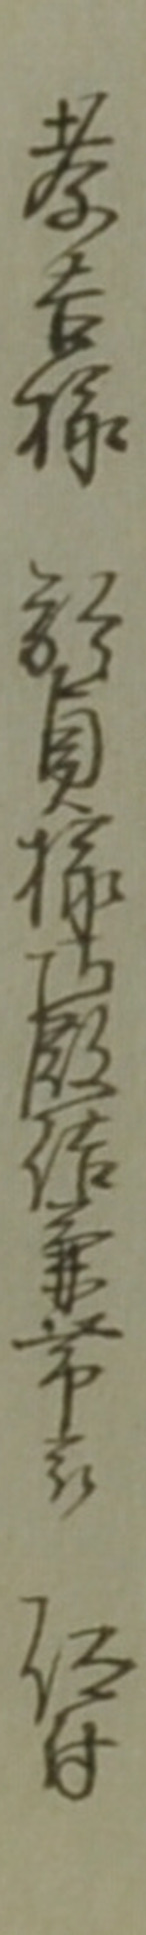孝吉様於貞様御殿詰兼帯被仰付
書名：無足諸士勤仕録（八）
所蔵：伊那市立高遠町図書館・合同会社AMANE
